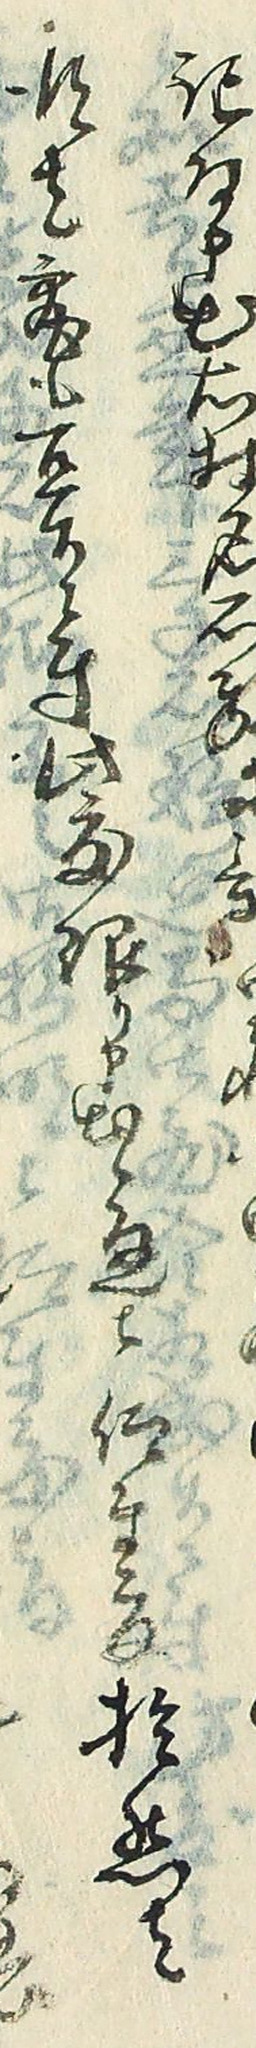得者究も宜候ニ付此度限り申出候通被仰付度於然者
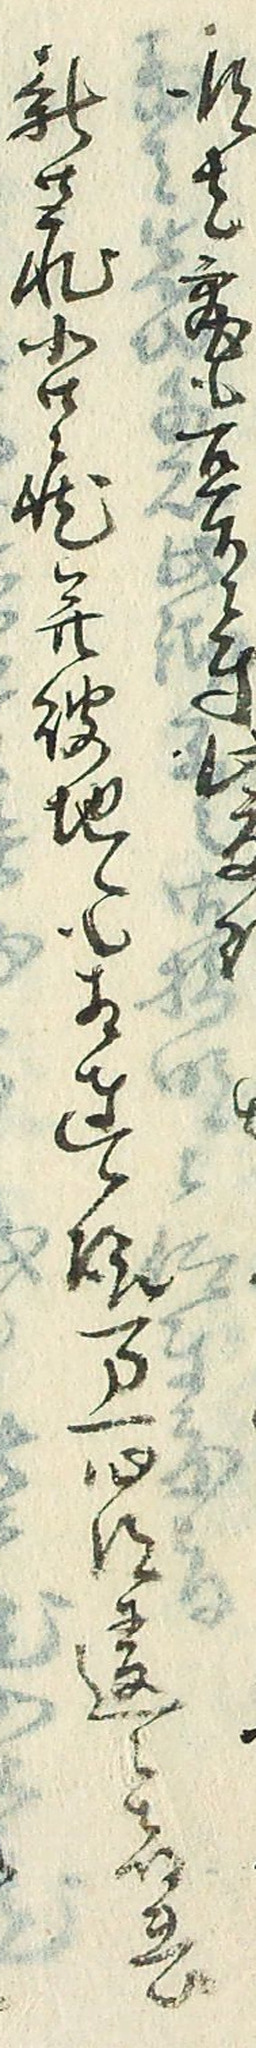新御蔵北御蔵幷彼地へも相達候様万一心得違之者共
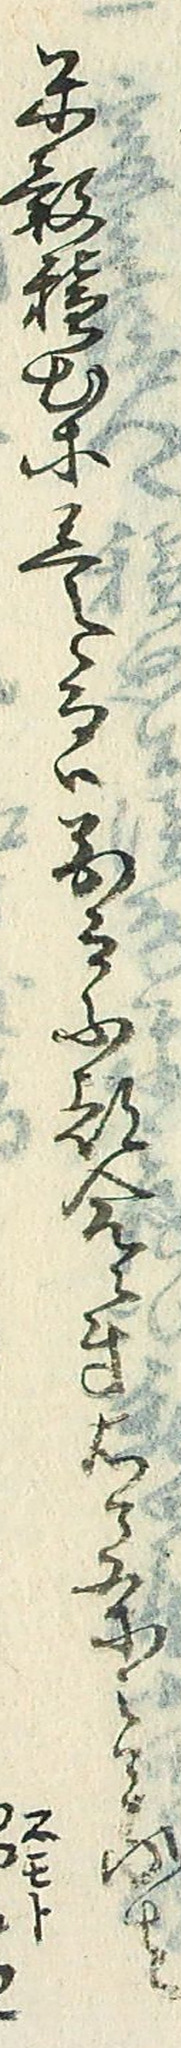米穀積出等有之候而ハ別而不都合ニ付右ケ条之御義者
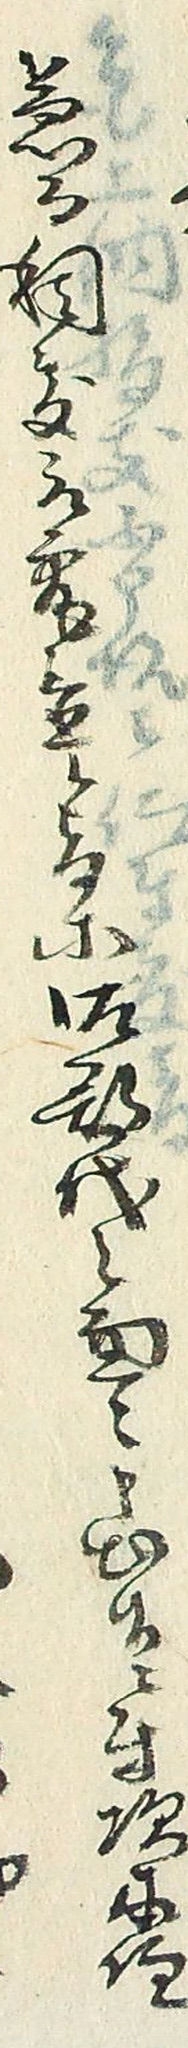兼而稠敷取究置候旨等御郡代之面々申出候ニ付須本住
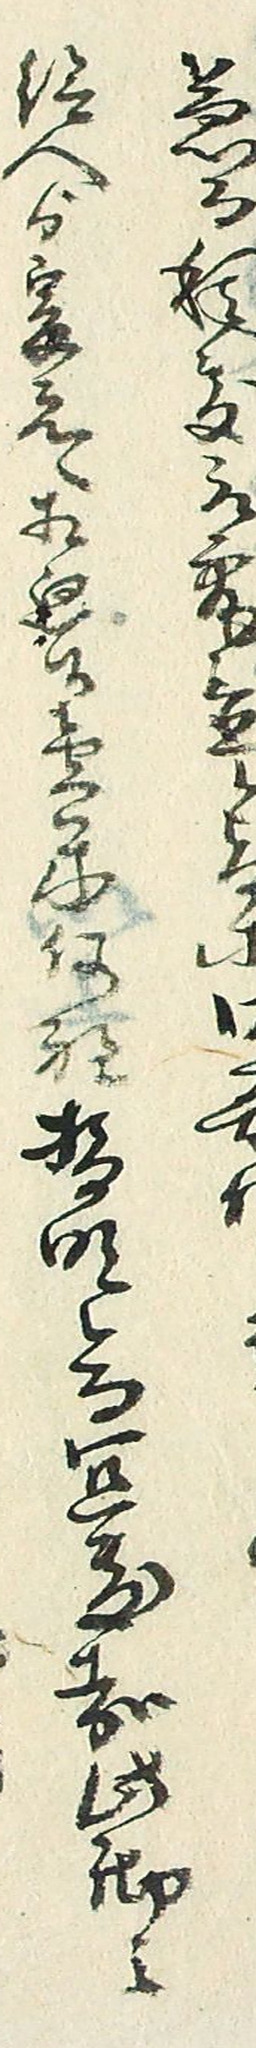給人ゟ爰元へ相廻候賣米何程指明候而宜敷哉此砌之
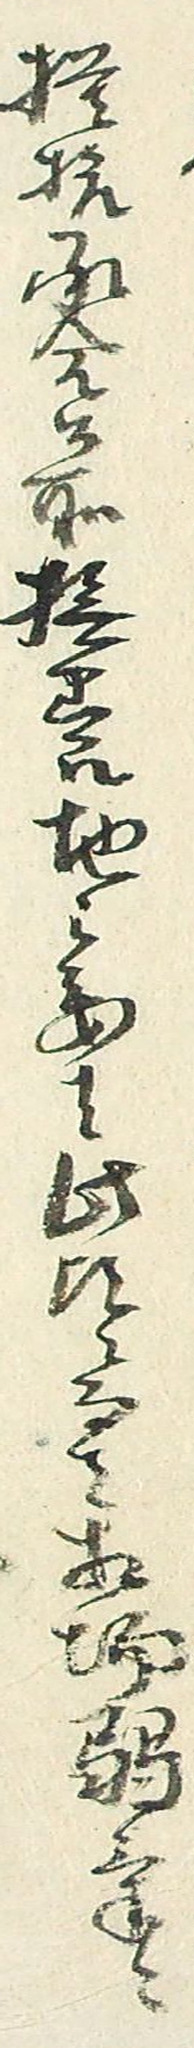模様承合候所撫養地之義者此頃ニ而者相場弱気ニ
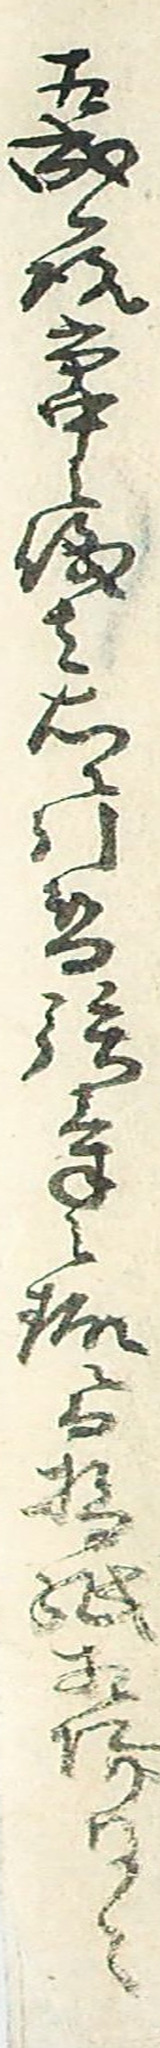相成候様市中之儀者右ニ引替強気之趣ニ而指紙相場日々

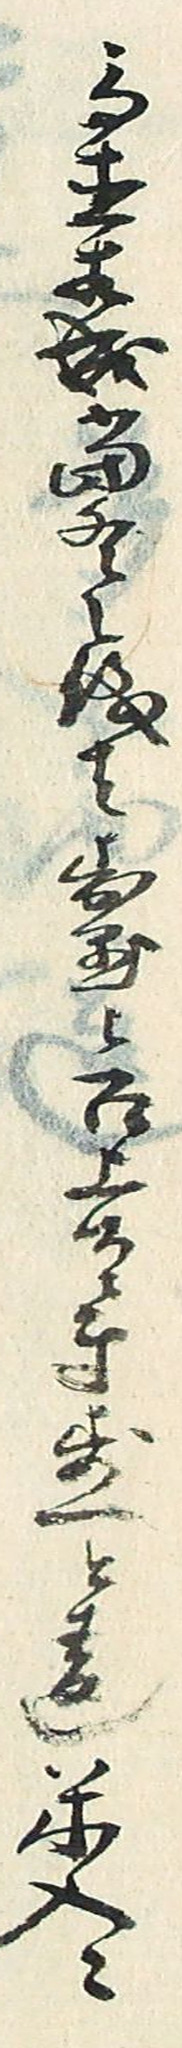高直相成當冬之儀者歩懸被召上候ニ付歩一と違米入ニ
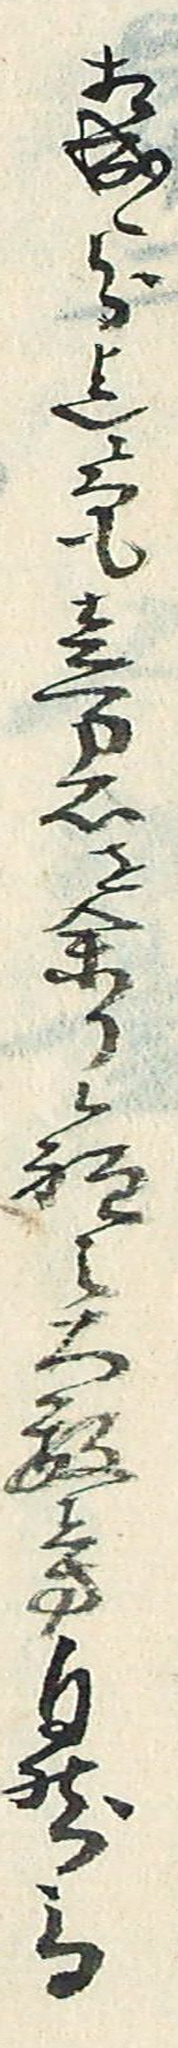相成候分迄ニ而も壱万石を余り候程之大数旁自然高
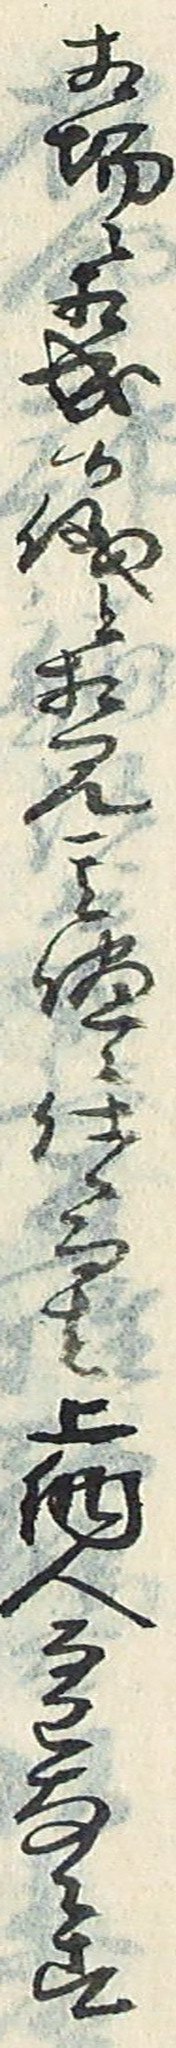相場ニ相成候儀と相見其儘ニ仕候而者上納人而已ならす
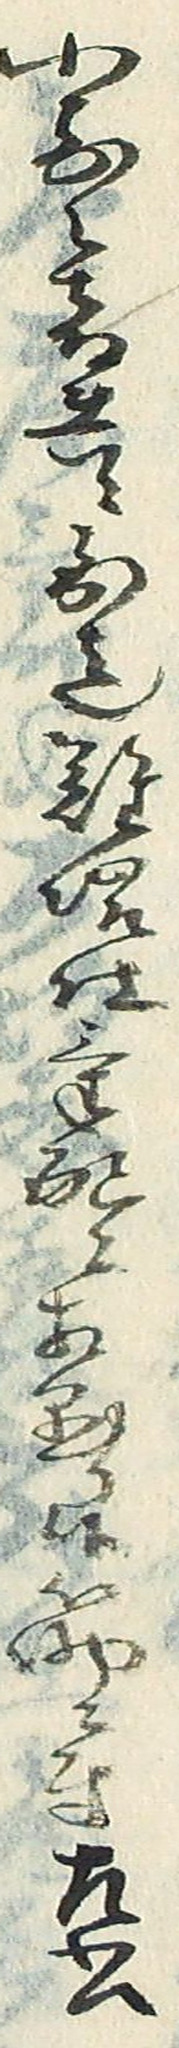小前之者共ニ至迄難渋仕氣配ニ相懸り候筋ニ付左書
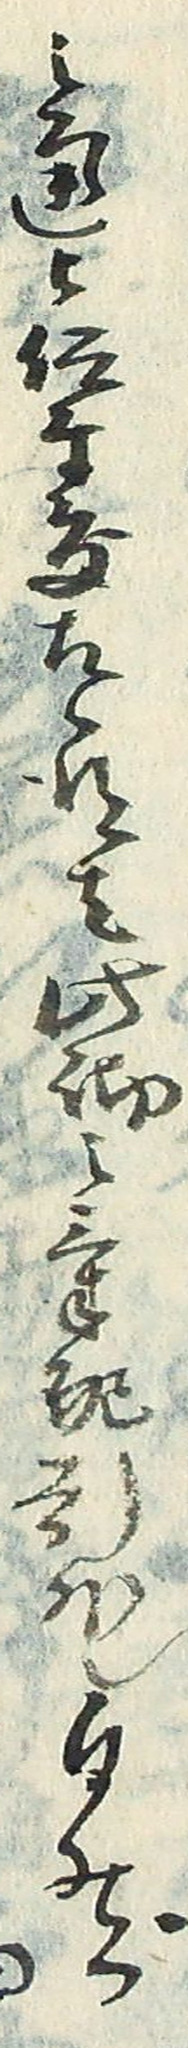之通被仰付度左候得者此砌之氣配引外し自然
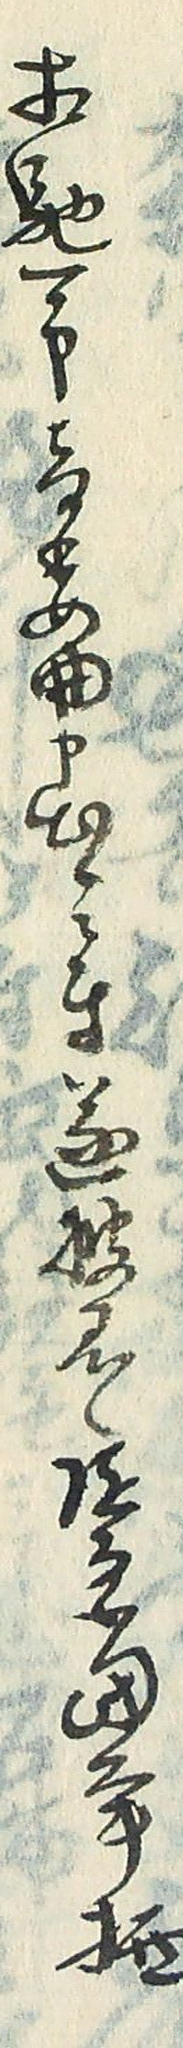相馳可申旨委曲申出候ニ付遂披見候随而當年柄
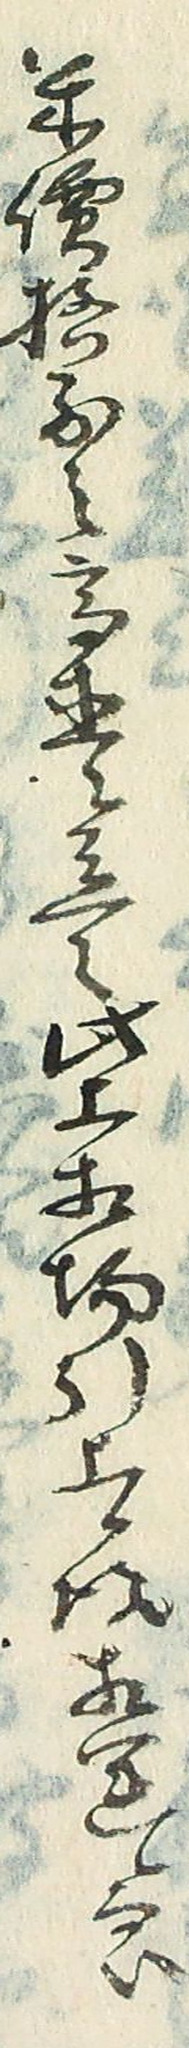米價格別之高直ニ有之此上相場引上候様相運候而ハ
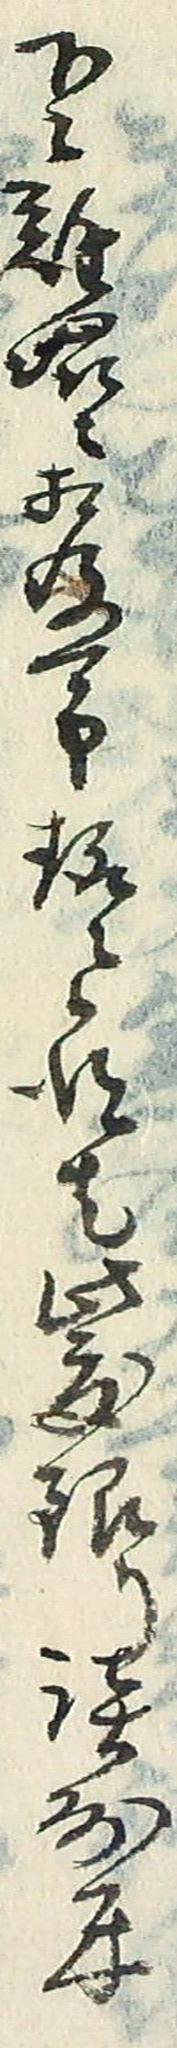下々難渋ニ相及可申趣ニ候得者此度限り淡州米
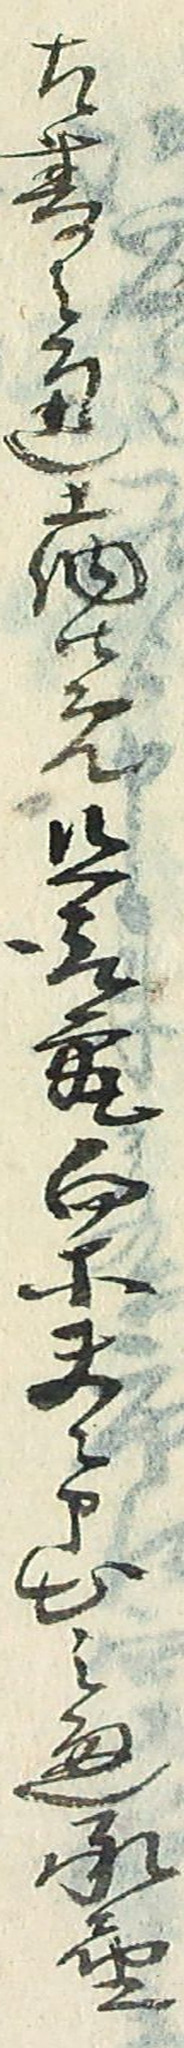左書之通上納御免且取究向等夫々申出之通承届
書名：諸御趣意書并御下知向之写
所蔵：鳴門教育大学 Naruto University of Education
